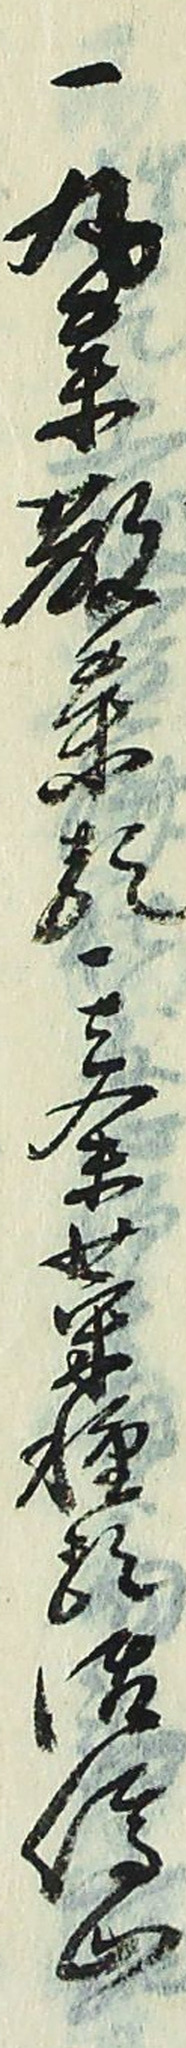一丸薬散薬類其余菜種類御停止
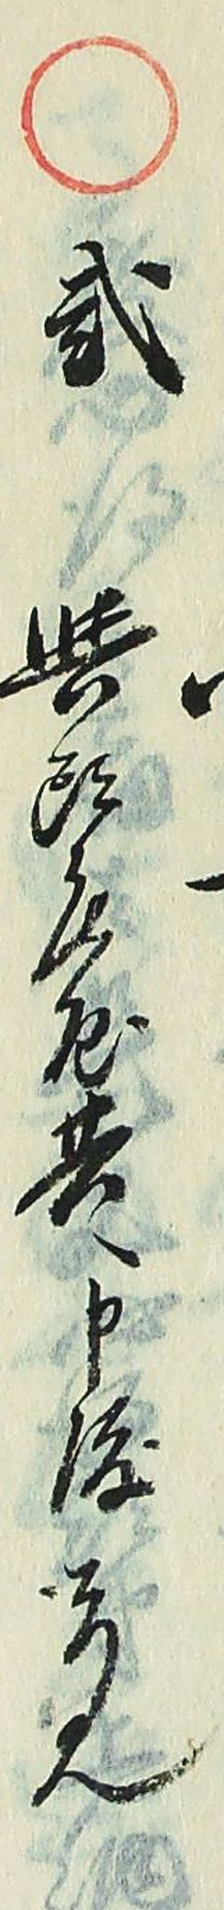○弐與頭庄屋共へ申渡覚
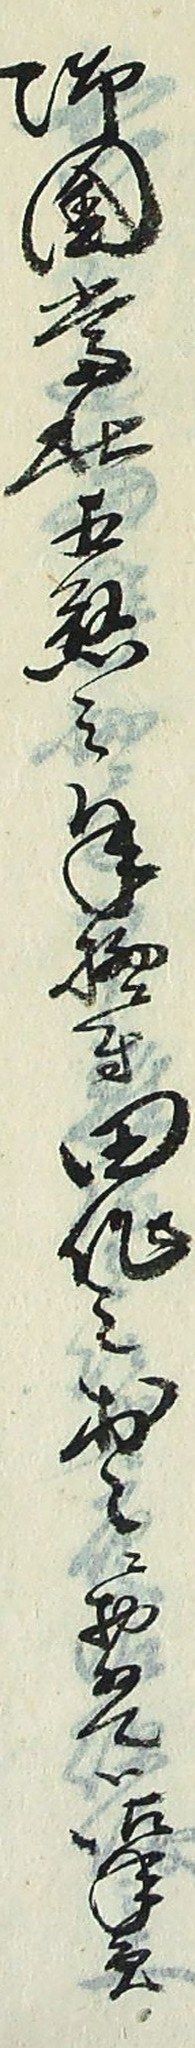御国當秋相熟之年柄ニ付田作之村々ニおゐてハ御年貢
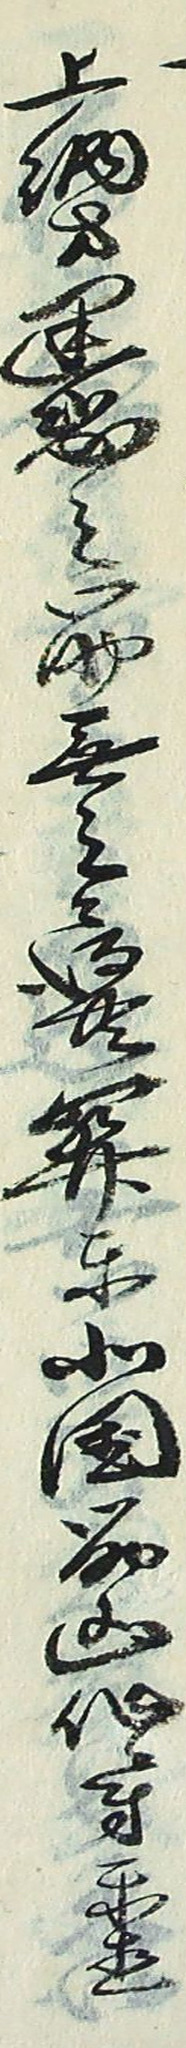上納方迷惑之筋無之候得共関東北国筋凶作ニ付米直
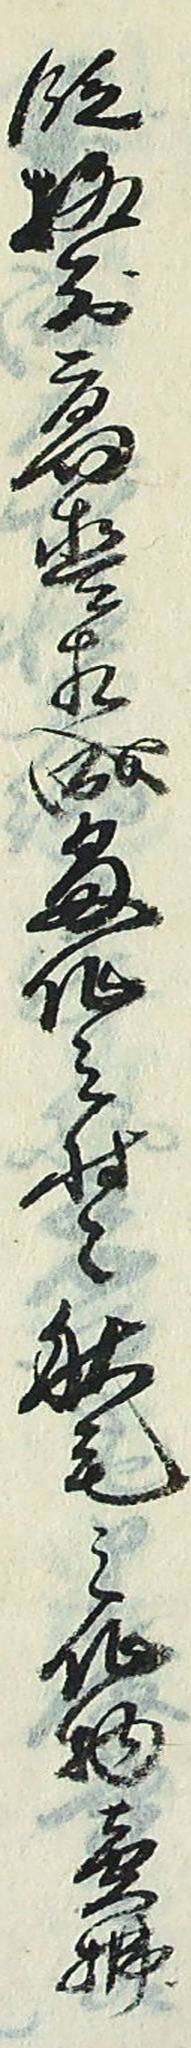段格別高直ニ相成畠作之村々秋毛之作物賣拂
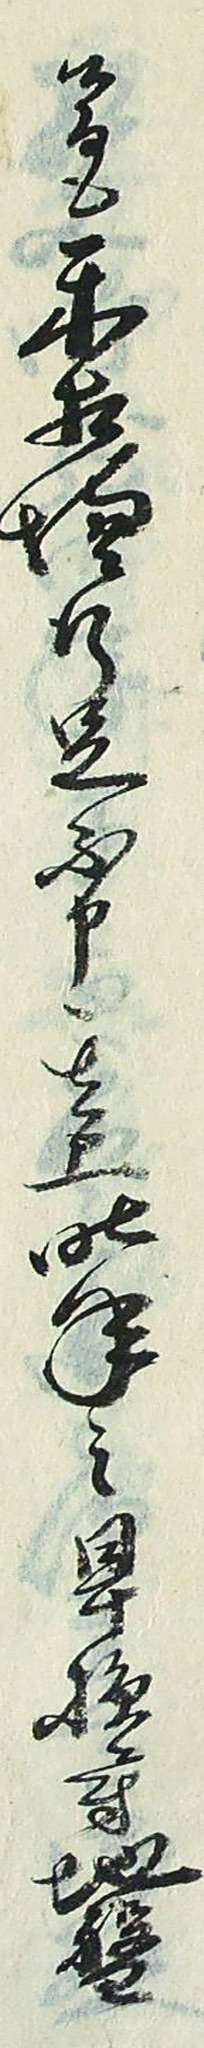候而も米相場行足不申其上昨年之旱損ニ付地盤

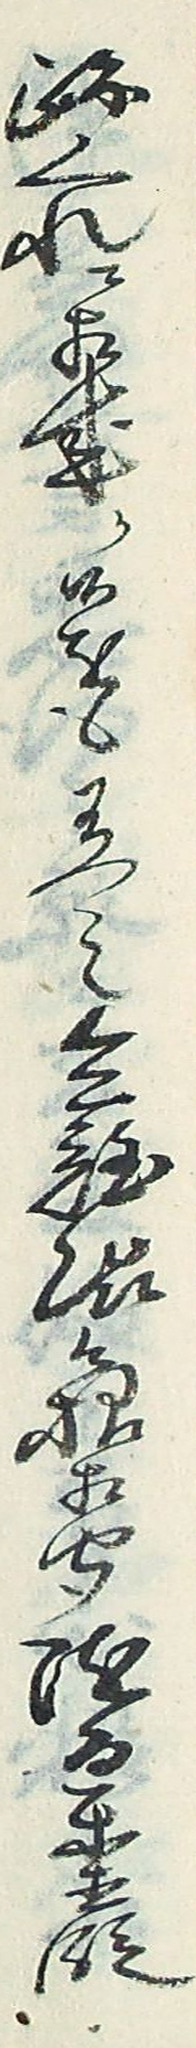跡くれニ相成り候をも有之令難渋候様相聞随而米直段
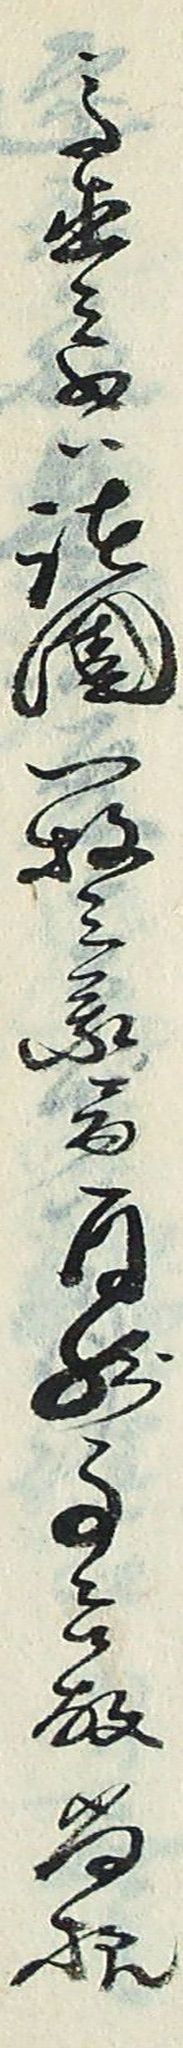高直之義ハ諸国一枚之義ニ而自然事ニ候故如何様
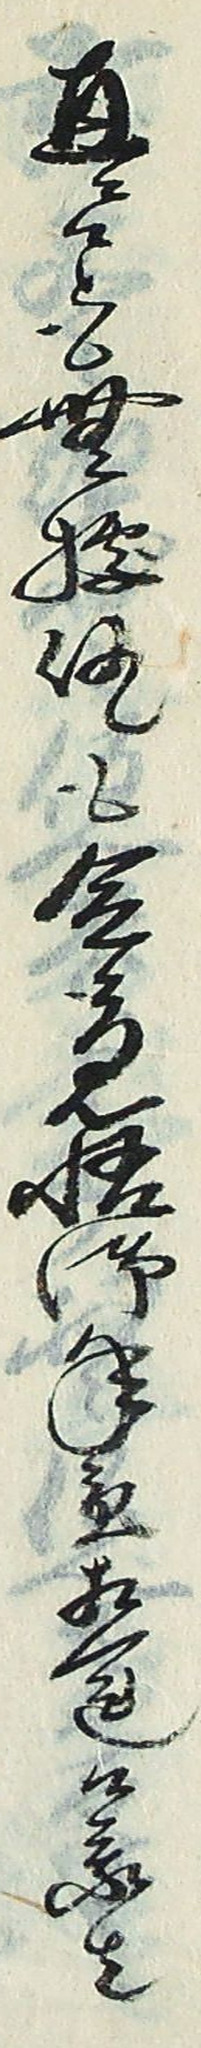直ニ候とも無據何れも全覚悟御年貢相運候義者
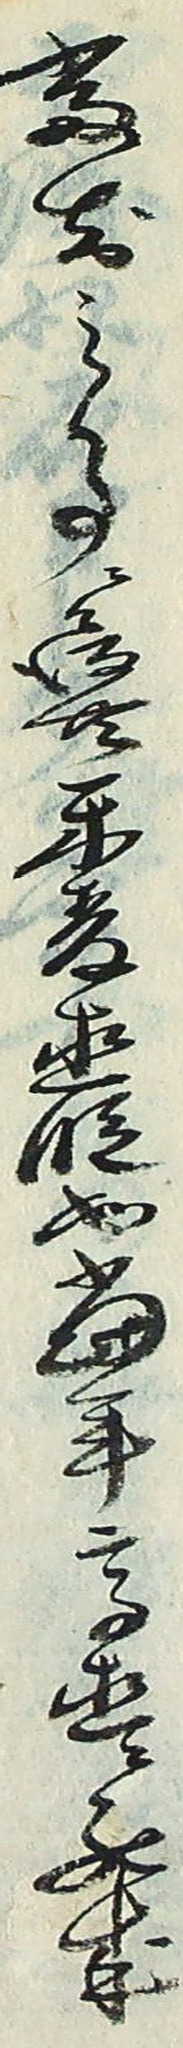當前之事ニ候得共米麦直段如當年高直ニ罷成
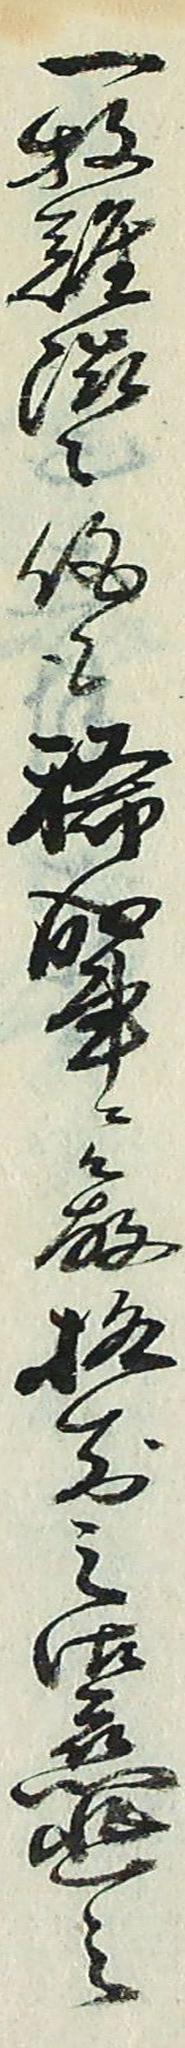一枚難渋之儀も稀成事ニ候故格別之御慈悲之
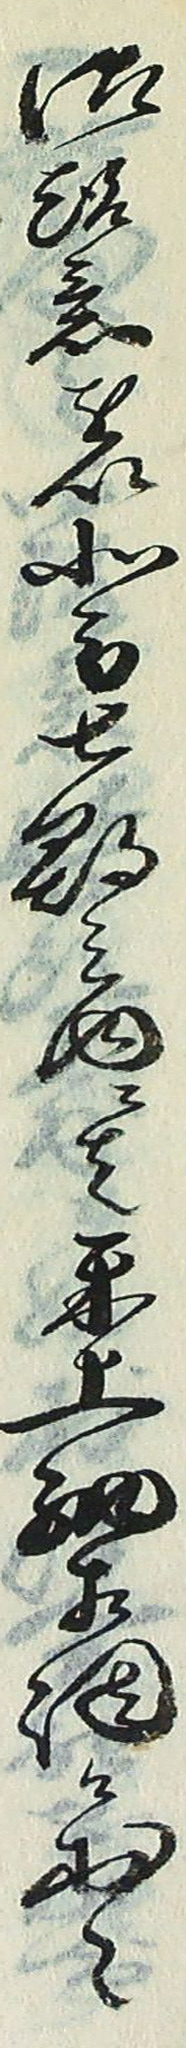御趣意を以北方七郡之内ニ者米上納相調候村々
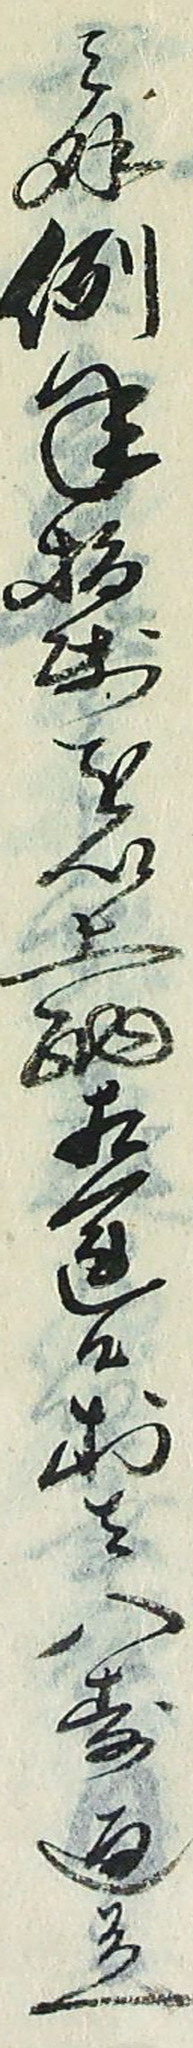之外例年指帋を以上納相運候村者八歩通有
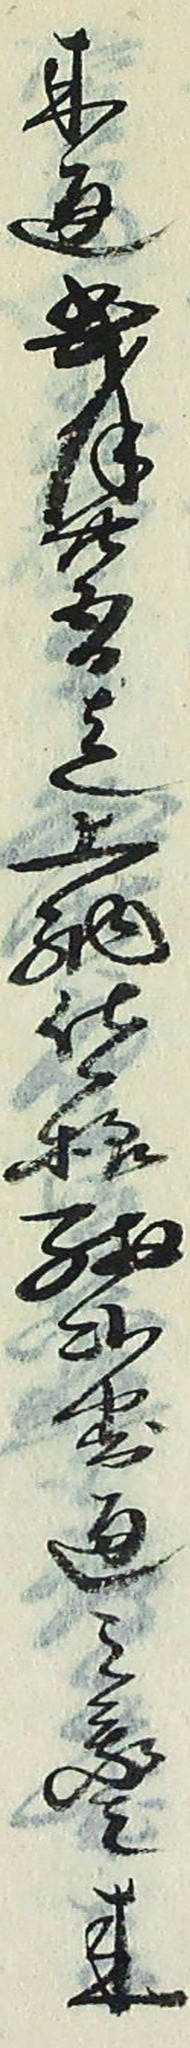来通當月廿五日迄上納仕候様残弐歩通之義者来
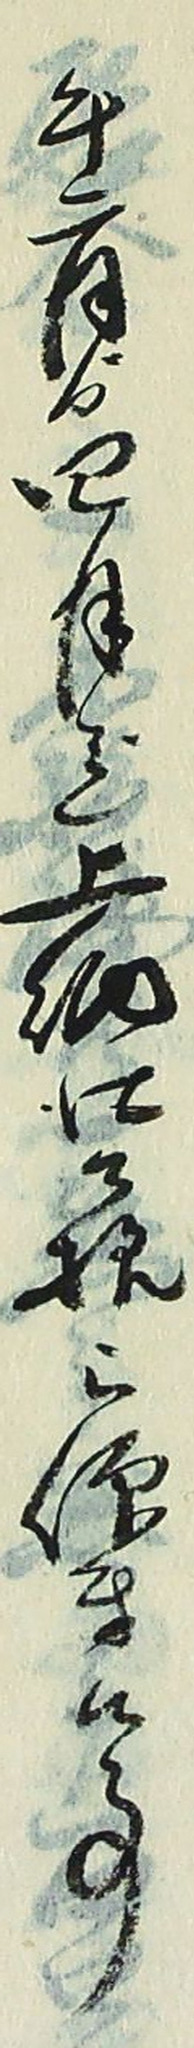午二月ゟ四月迄上納仕候様被仰付候事
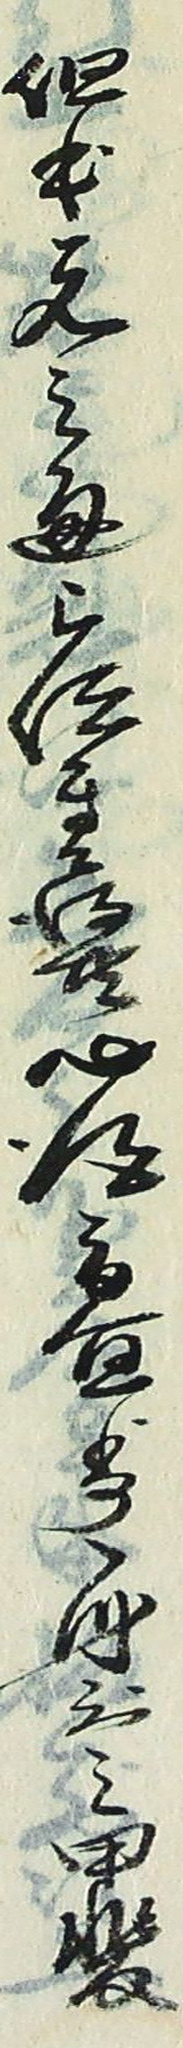但本元之通被仰付候得共心得方宜布身分之甲斐
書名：諸御趣意書并御下知向之写
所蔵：鳴門教育大学 Naruto University of Education
